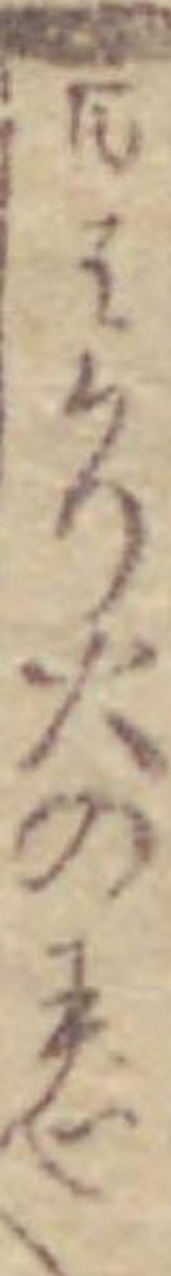日はかり火の用心
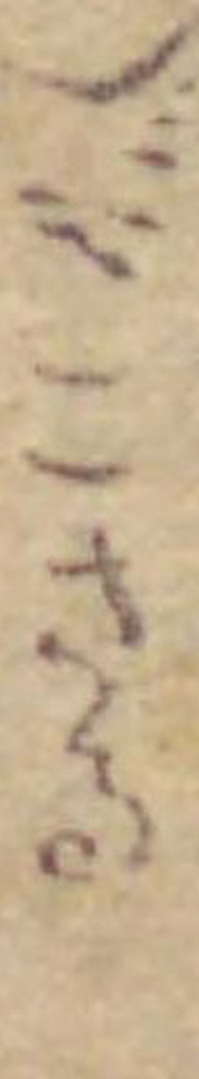こさる
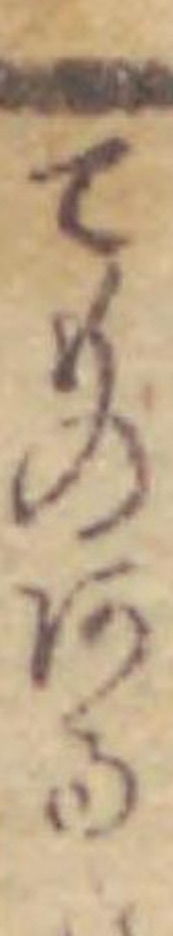てものある
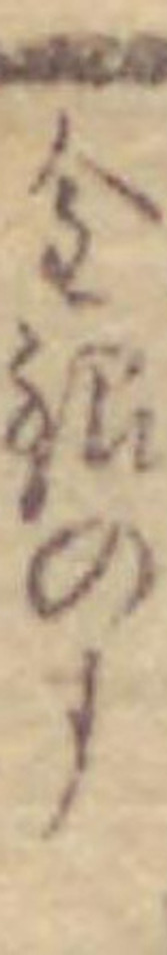金銀のす
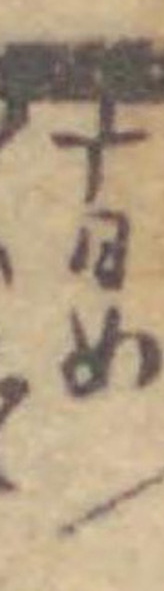十日め
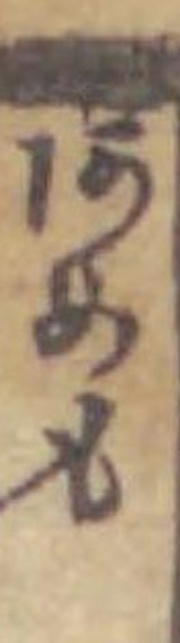あめも
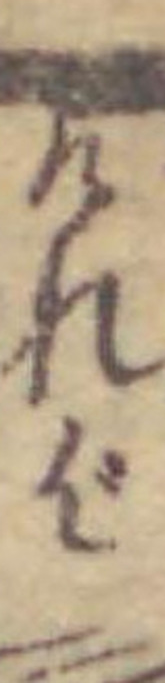ければ
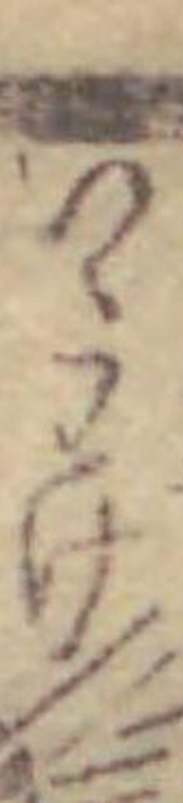いゝわけ
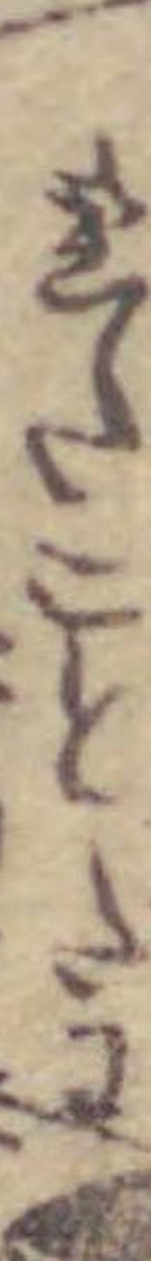れたことだわ
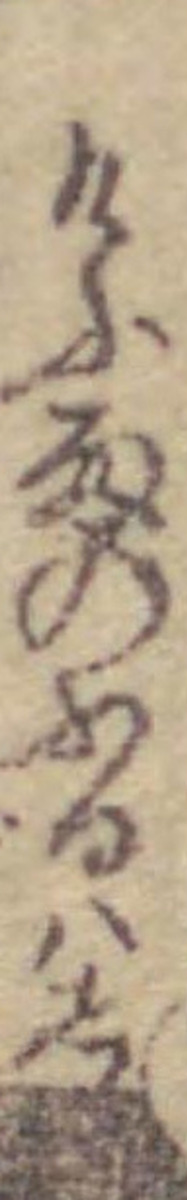けふの雨のふるはし
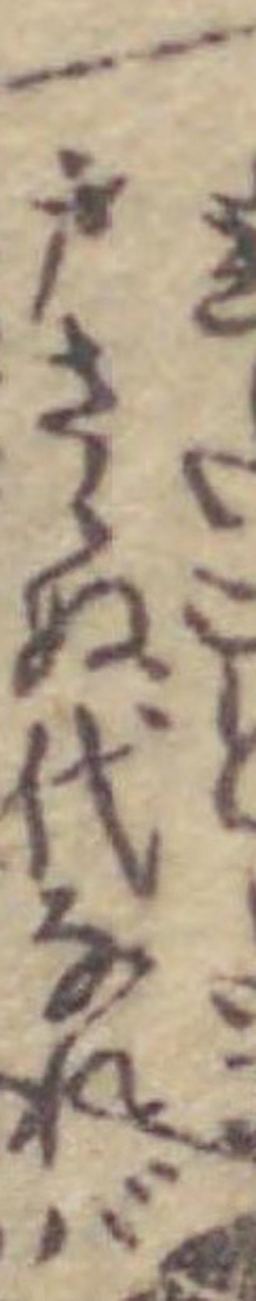戸さらぬ代なれば
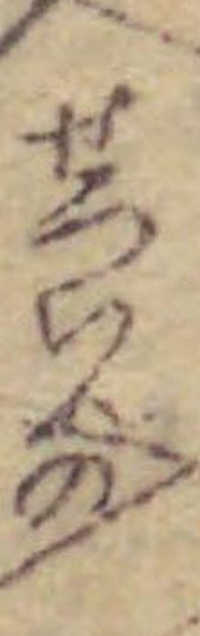せついんの
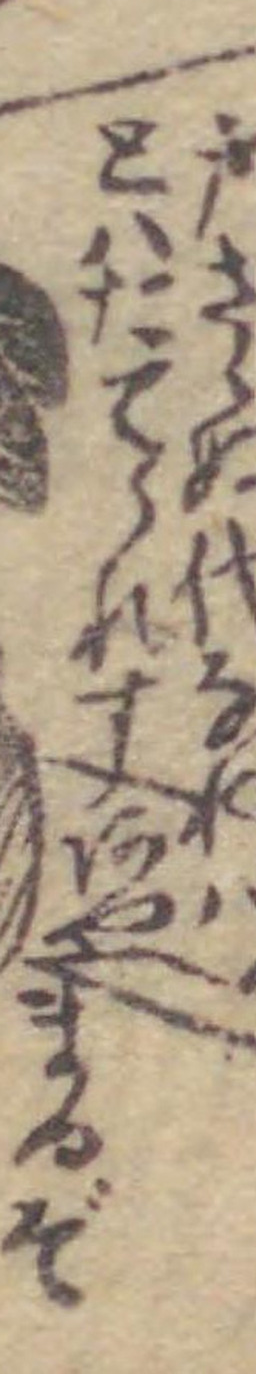とはたてられすあやまるぞ
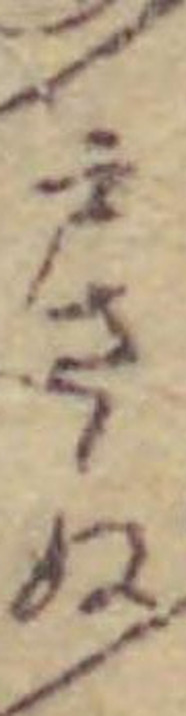戸さらぬ
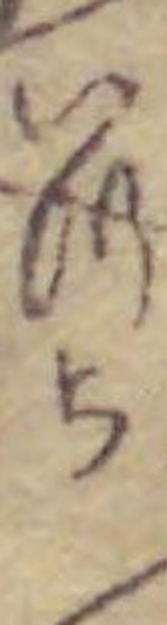いつち
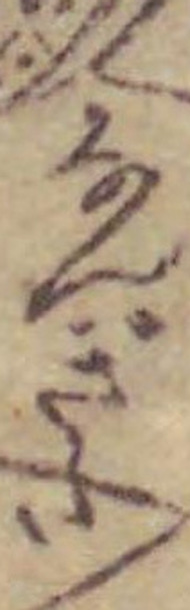なんぎた
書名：天下一面鏡梅鉢 : 3巻
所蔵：国立国会図書館 National Diet Library, JAPAN
